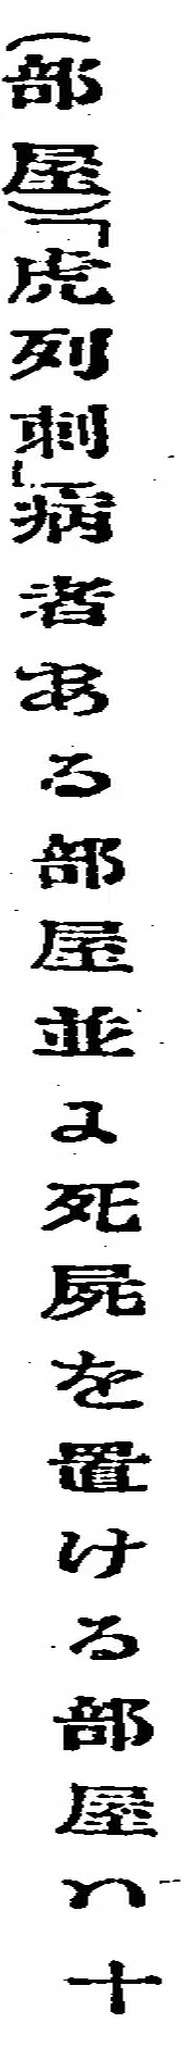(部屋)「虎列刺」病者ある部屋並に死屍を置ける部屋は十
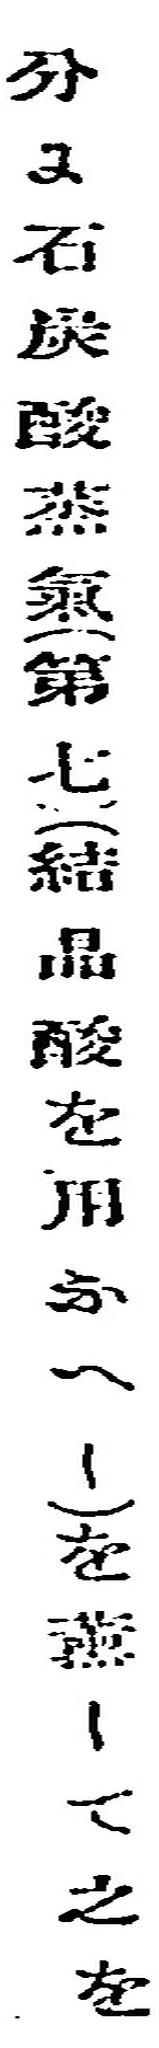分に石炭酸蒸気(第七)(結晶酸を用ふへし)を薫して之を
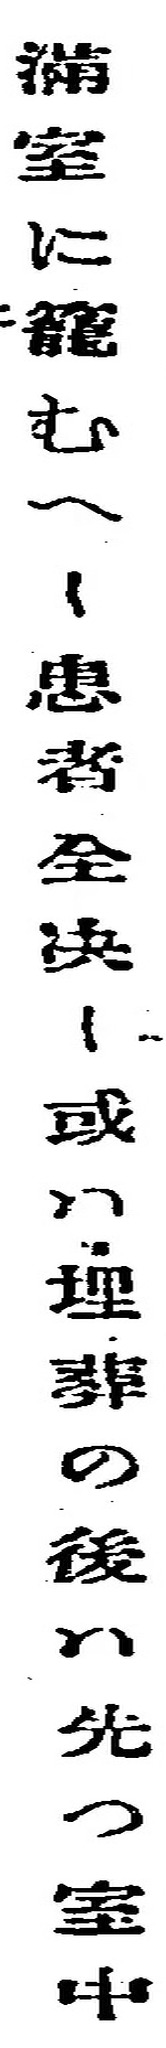満室に籠むへし患者全決し或は埋葬の後は先つ室中
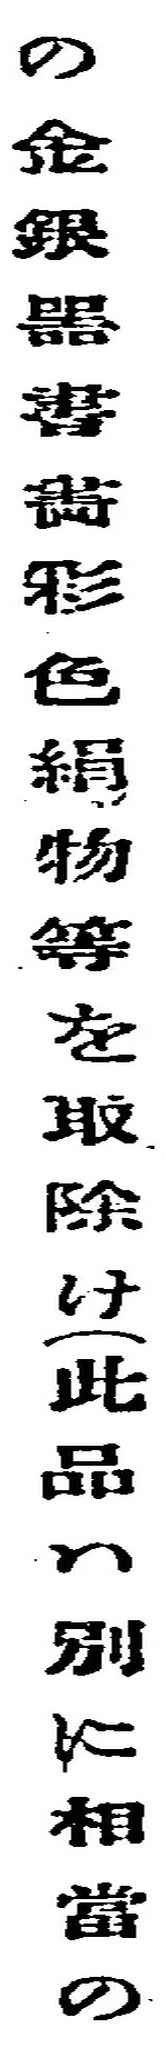の金銀器書画彩色絹物等を取除け(此品は別に相当の
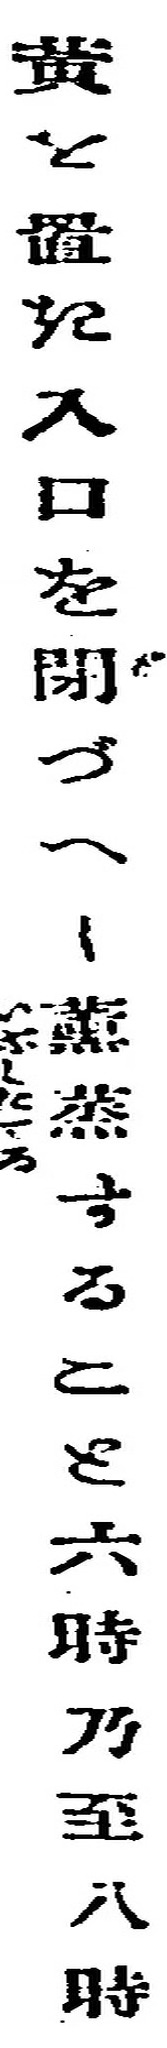黄を置き入口を閉づへし薫蒸すること六時乃至八時
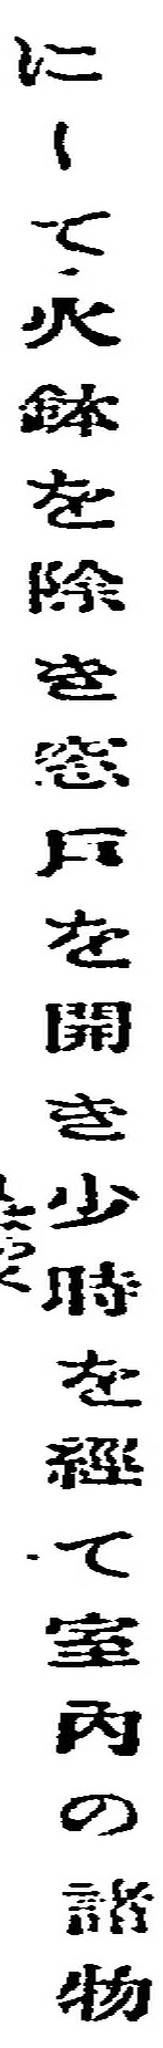にして火鉢を除き窓戸を開き少時を経て室内の諸物
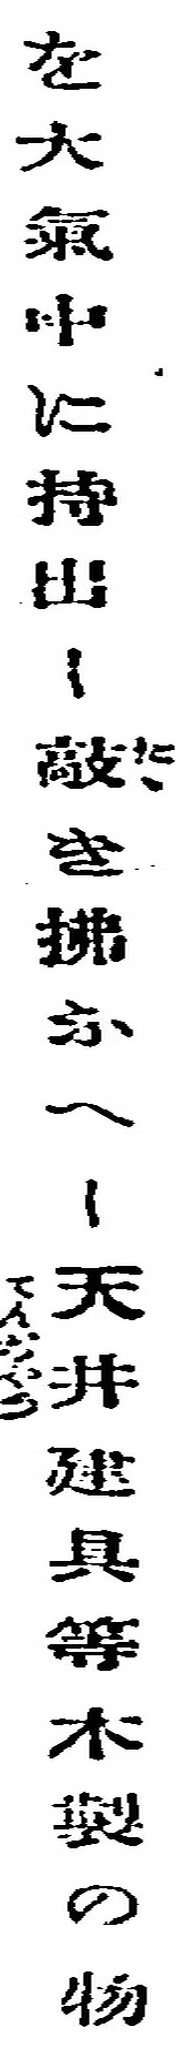を大気中に持出し敲き払ふへし天井建具等木製の物
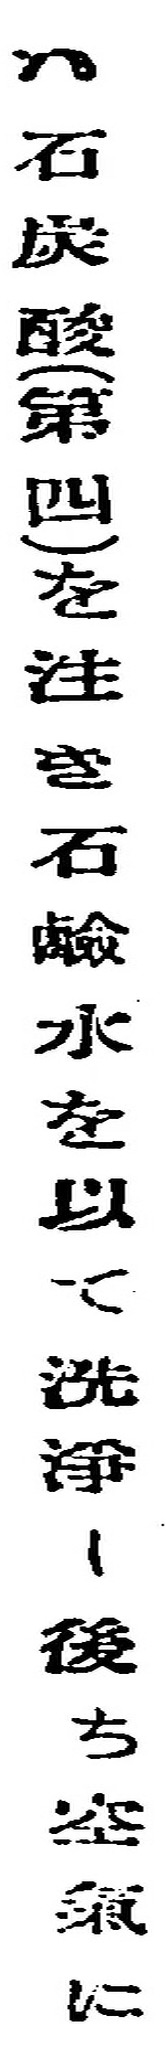は石炭酸(第四)を注き石鹸水を以て洗浄し後ち空気に
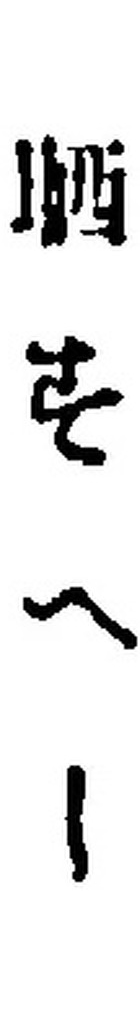晒すへし
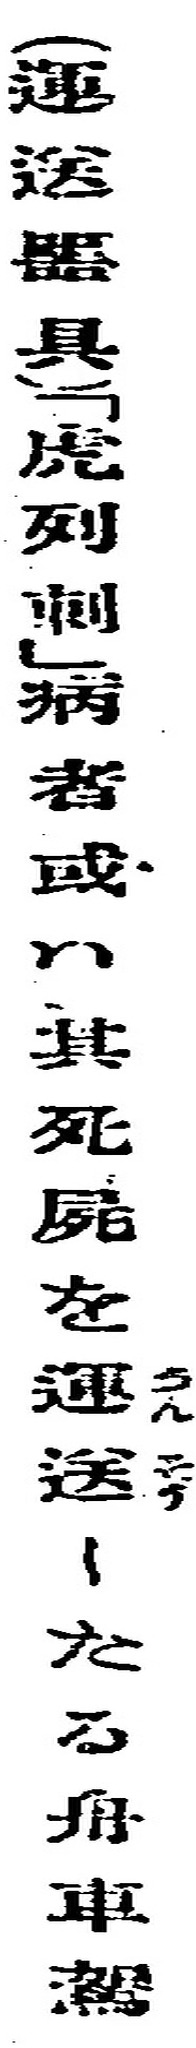(運送器具)「虎列刺」病者或は其死屍を運送したる舟車駕

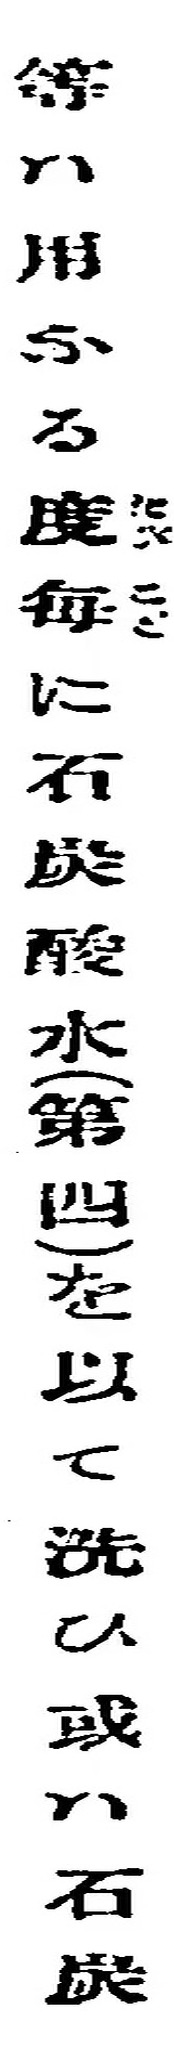等は用ふる度毎に石炭酸水(第四)を以て洗ひ或は石炭
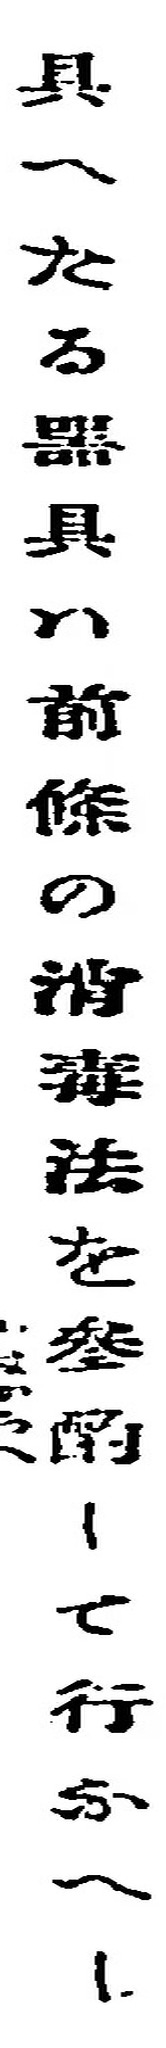具へたる器具は前条の消毒法を参酌して行ふへし
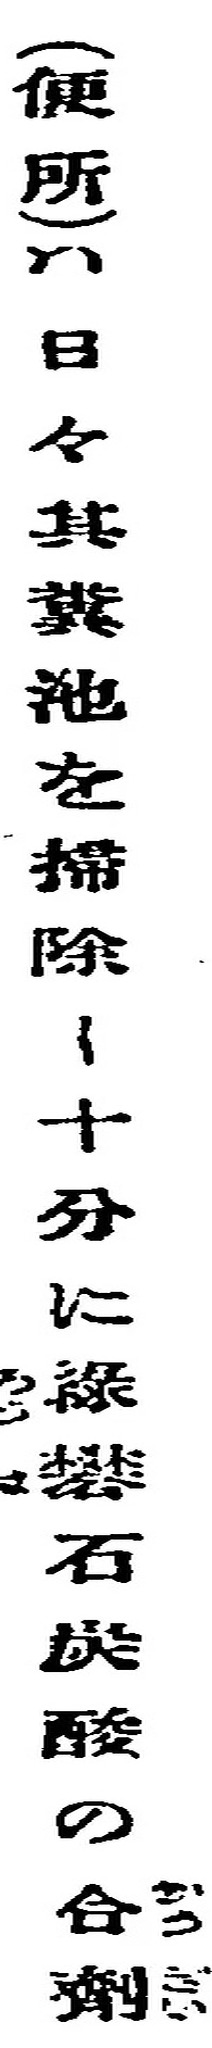(便所)は日々其糞池を掃除し十分に緑礬石炭酸の合剤
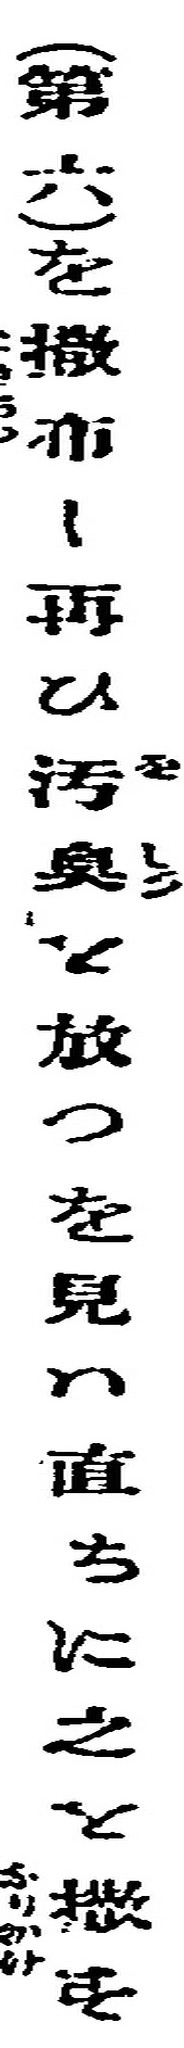(第六)を撒布し再ひ汚臭を放つを見は直ちに之を撒す
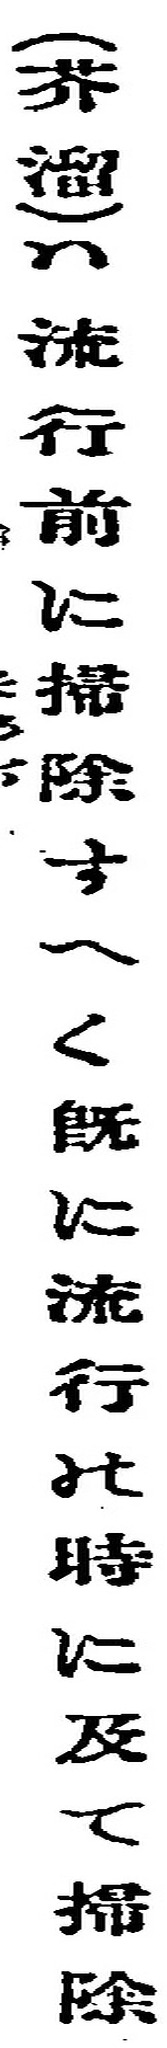(芥溜)は流行前に掃除すへく既に流行の時に及て掃除
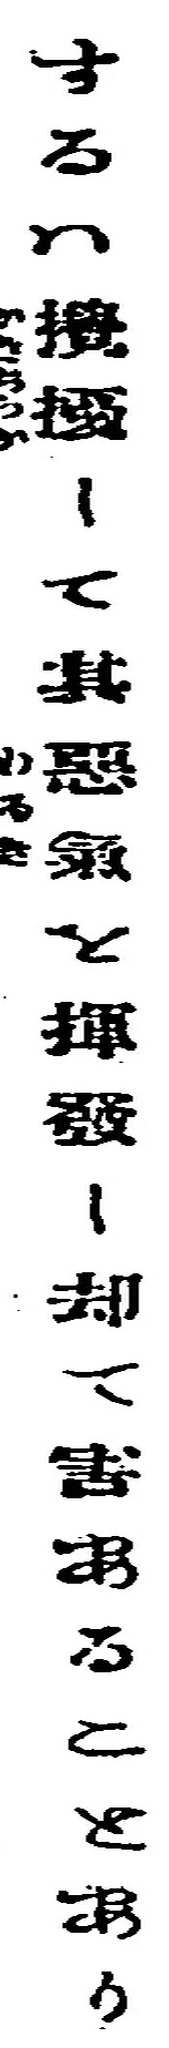するは攪擾して其悪気を揮発し却て害あることあり
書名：これら病予防心得
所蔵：国立国会図書館 National Diet Library, JAPAN
